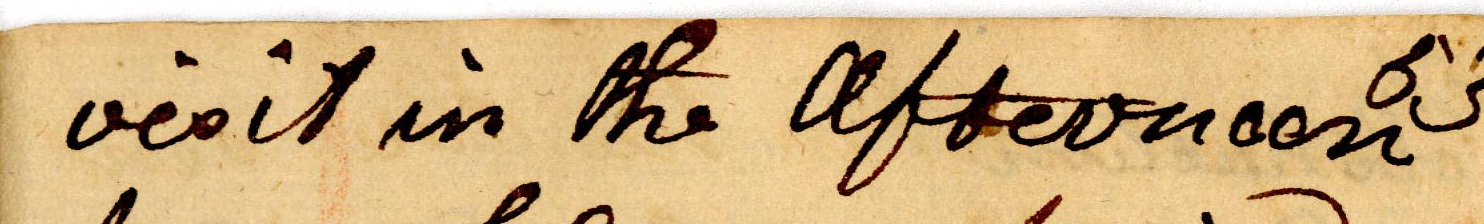visit in the Afternoon
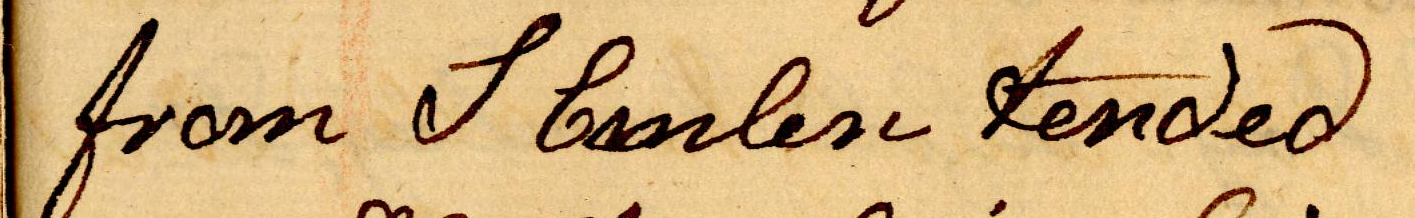from S Emlen tended
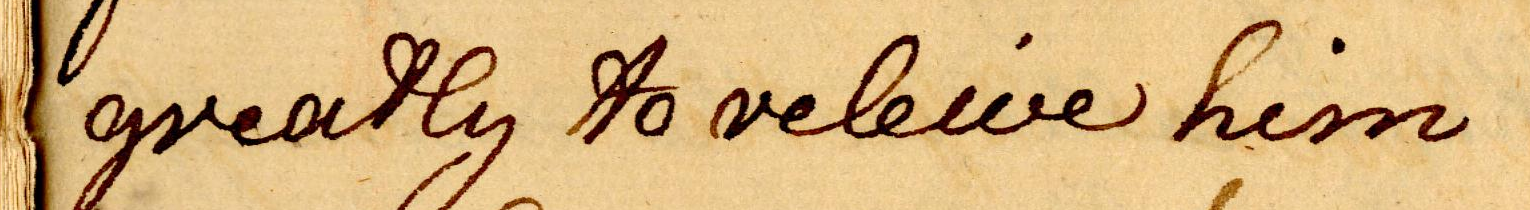greatly to releive him
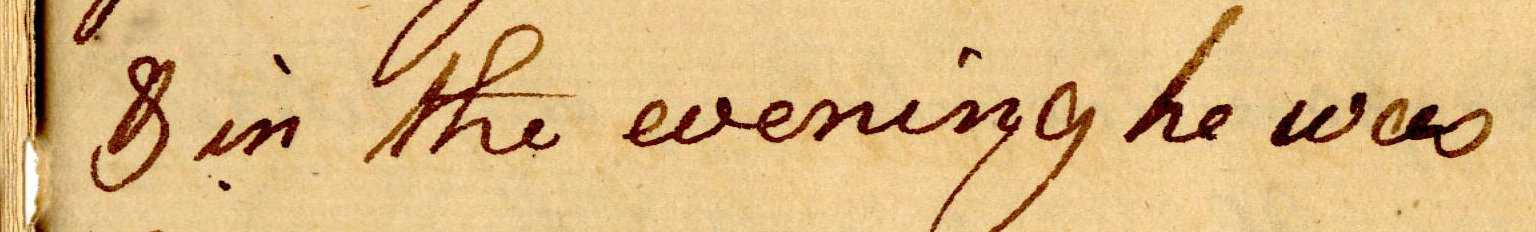& in the evening he was
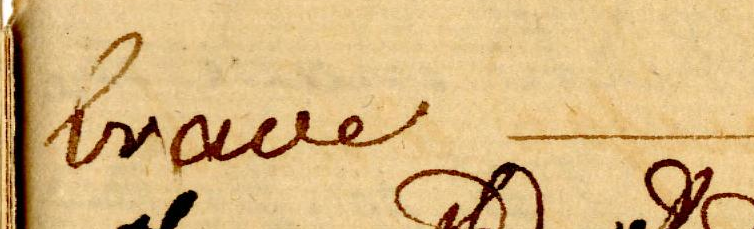brave-
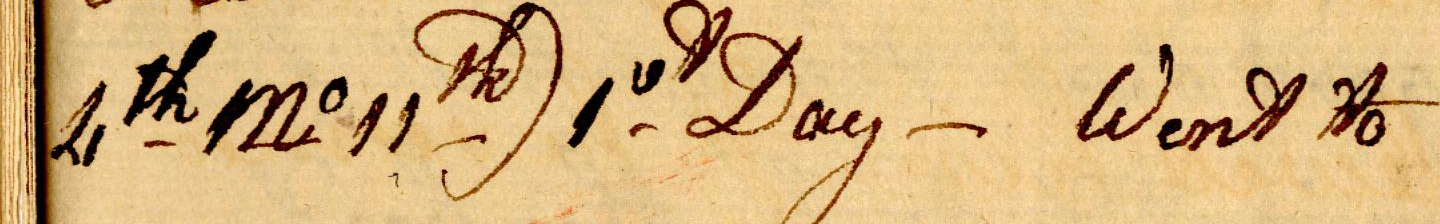4^th M^o 11^th) 1^st Day- Went to
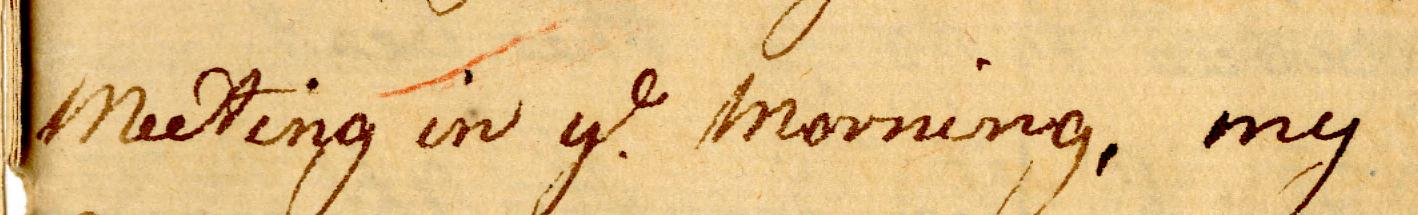Meeting in y^e Morning, my
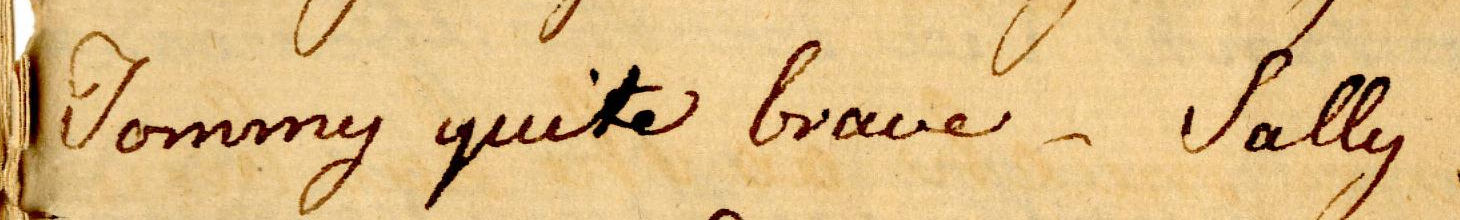Tommy quite brave- Sally
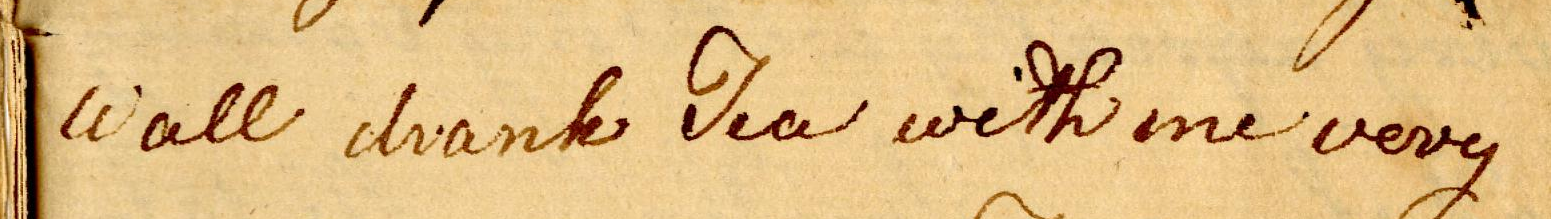Wall drank Tea with me very
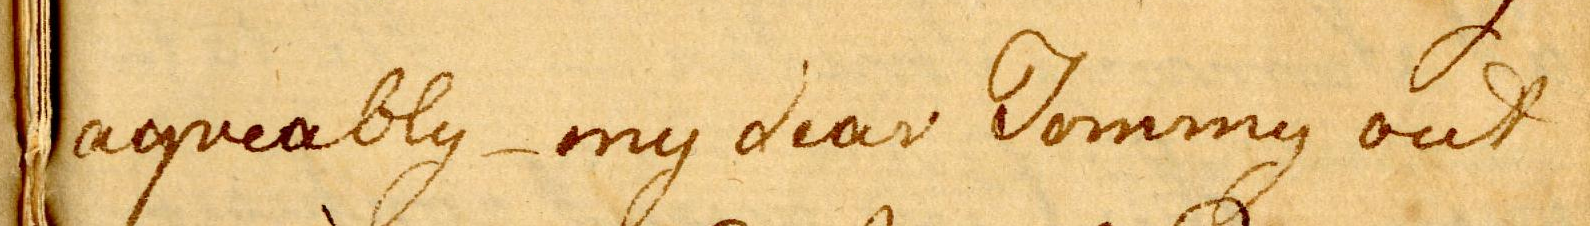agreably- my dear Tommy out
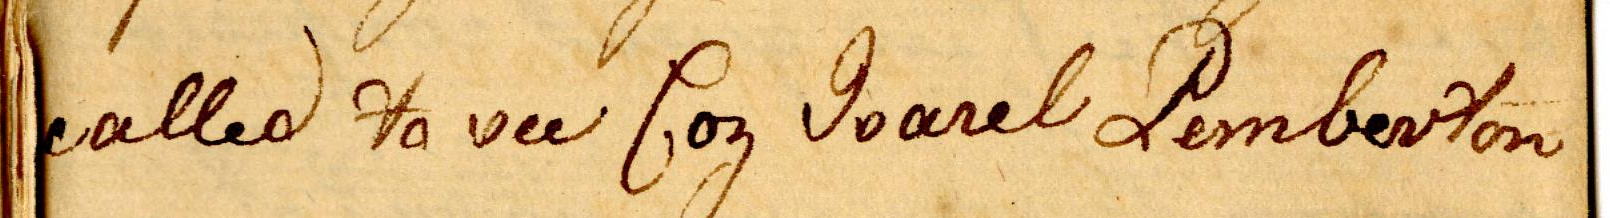called to see Coz Isarel Pemberton
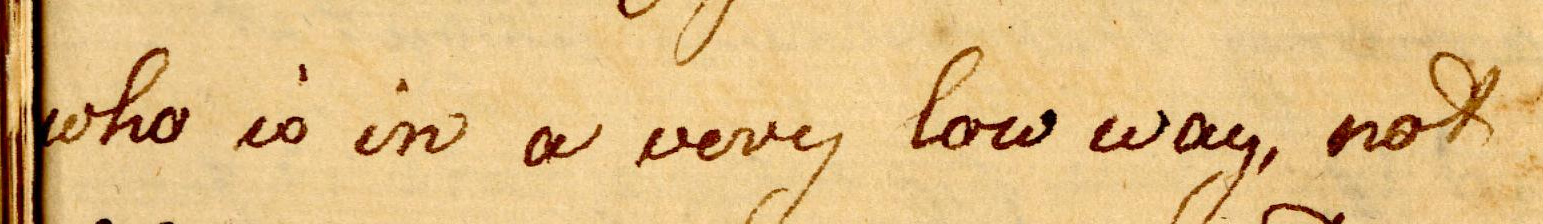who is in a very low way, not
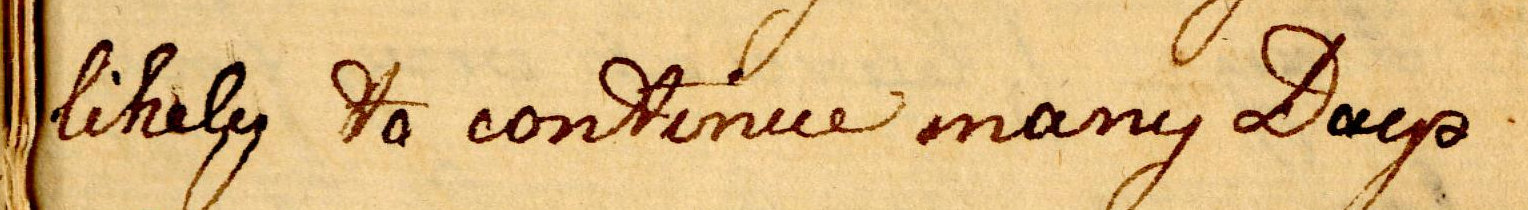likely to continue many Days
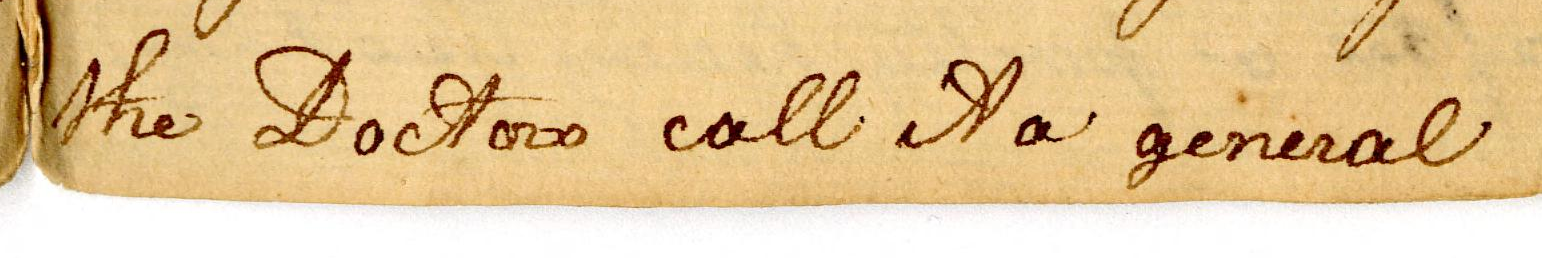the Doctors call it a general
